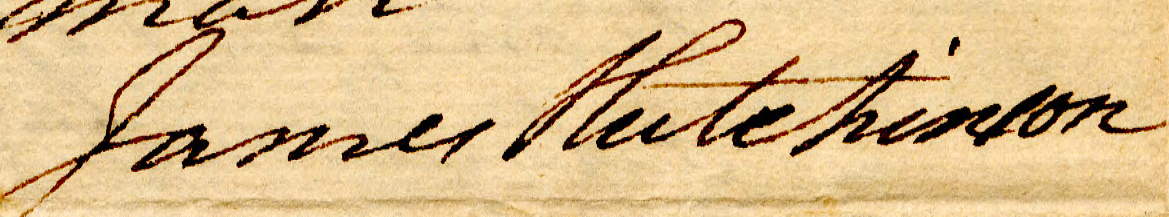James Hutchinson
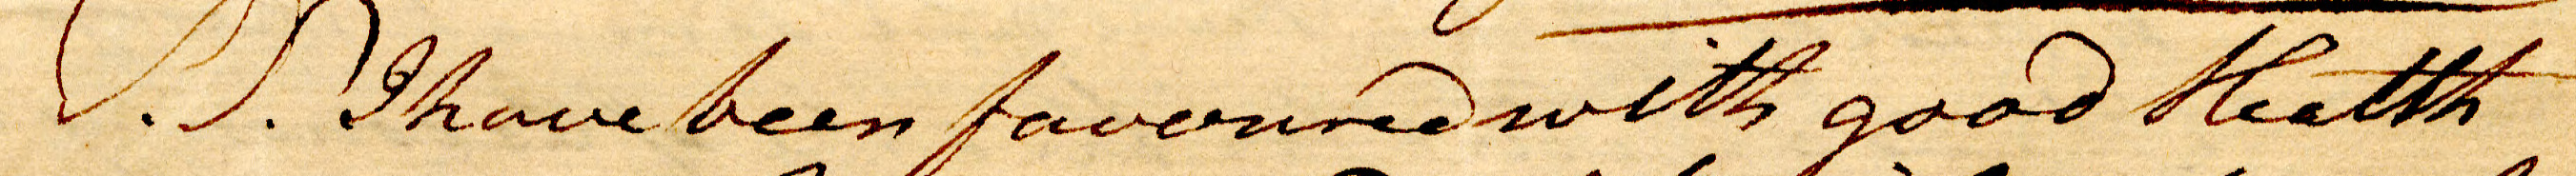P.S. I have been favoured with good Health
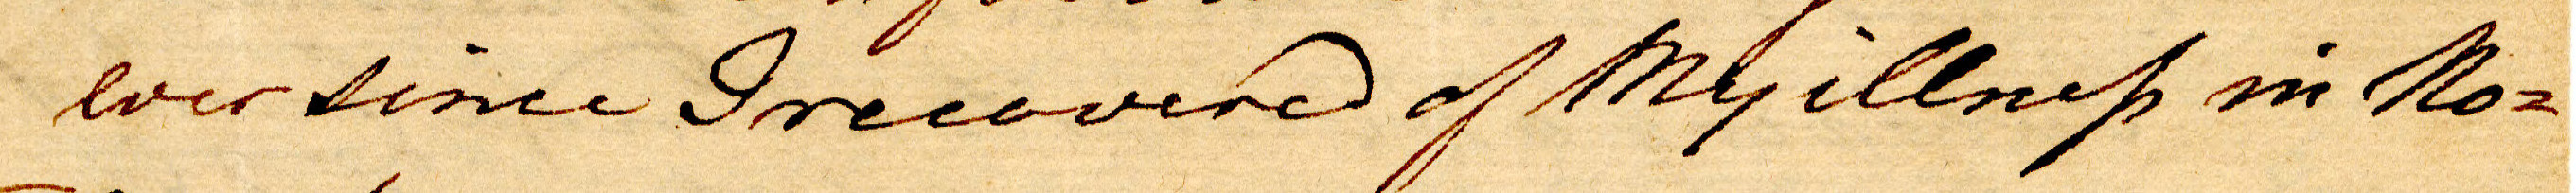ever since I recovered of My illness in No-
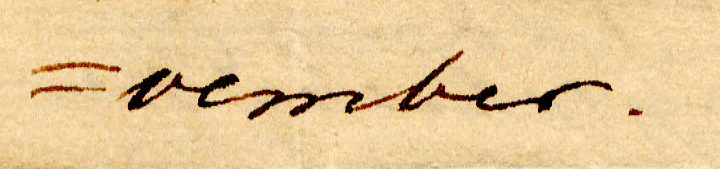-vember
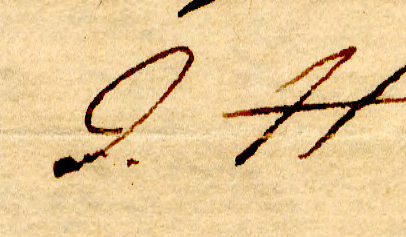J. H
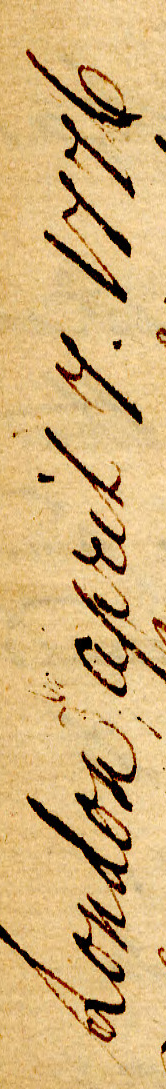London, april 7. 1776
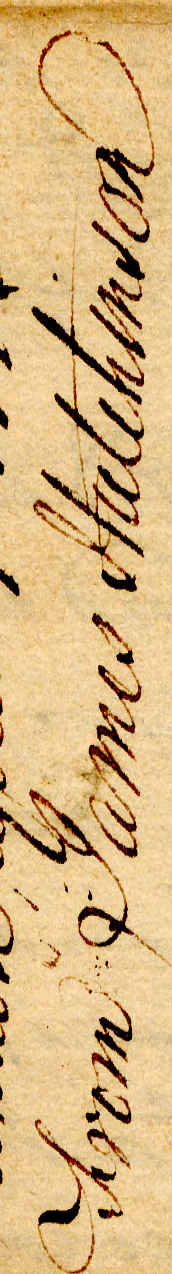From James Hutchinson
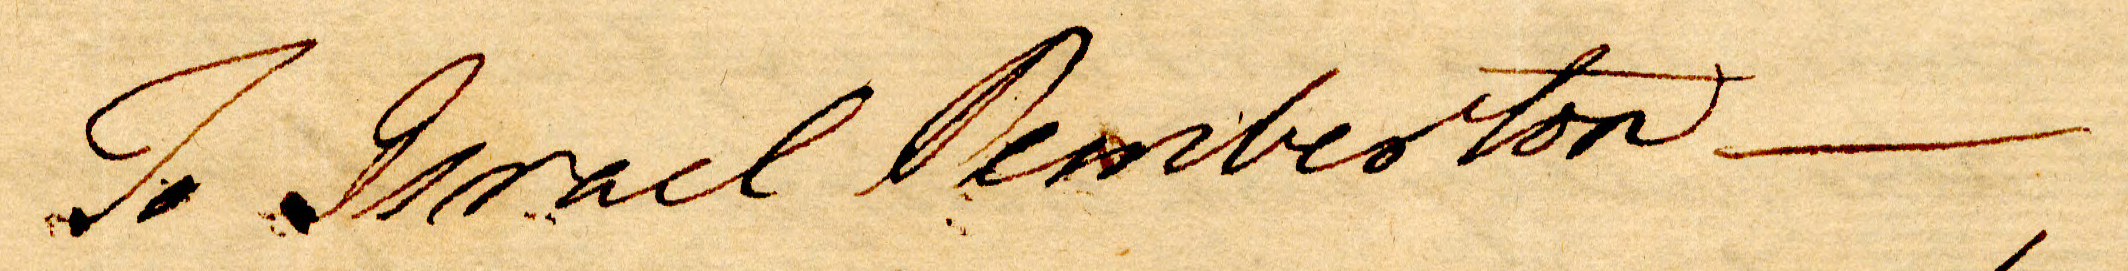To Israel Pemberton-
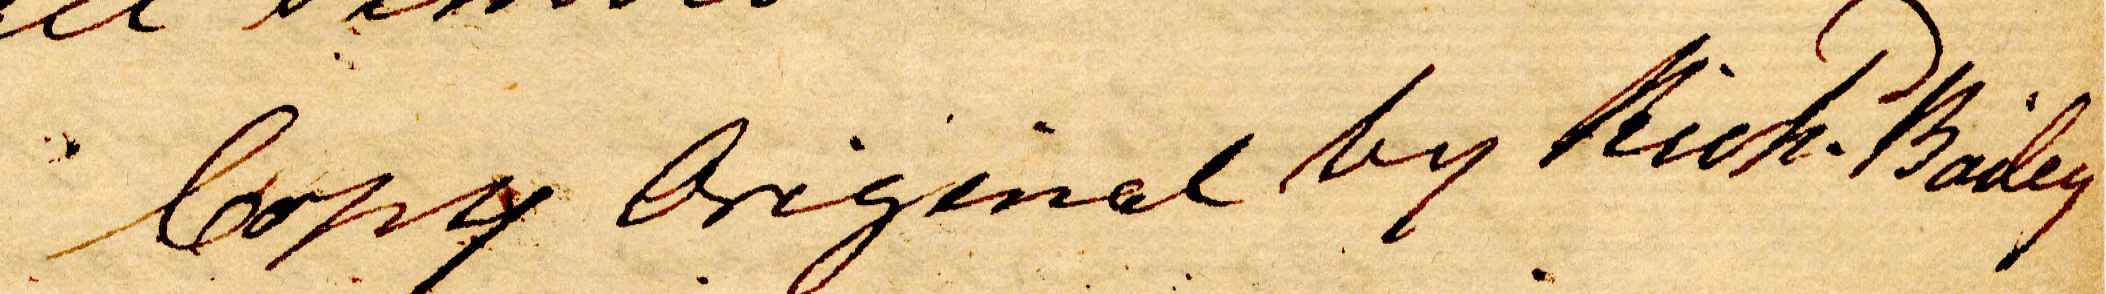Copy Original by Rich.^d Bailey
